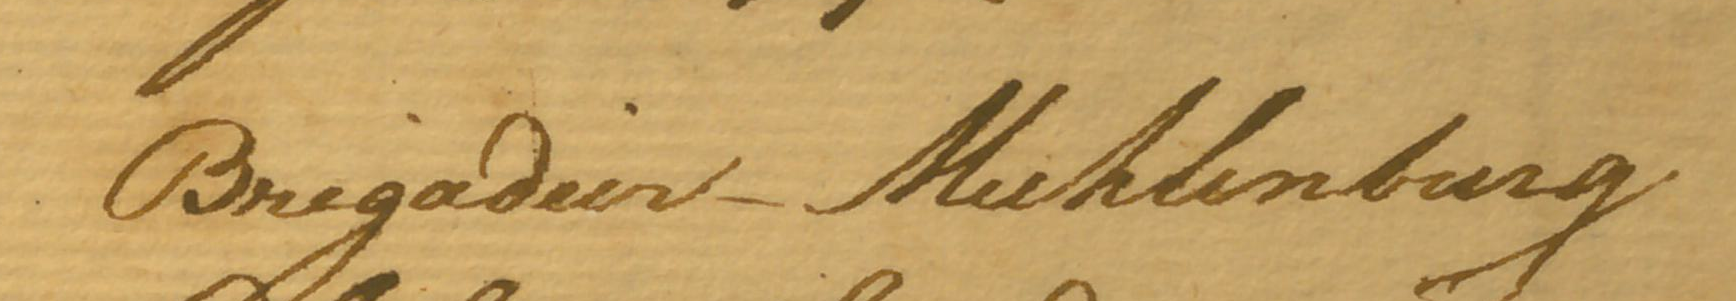Brigadier- Muhlenburg
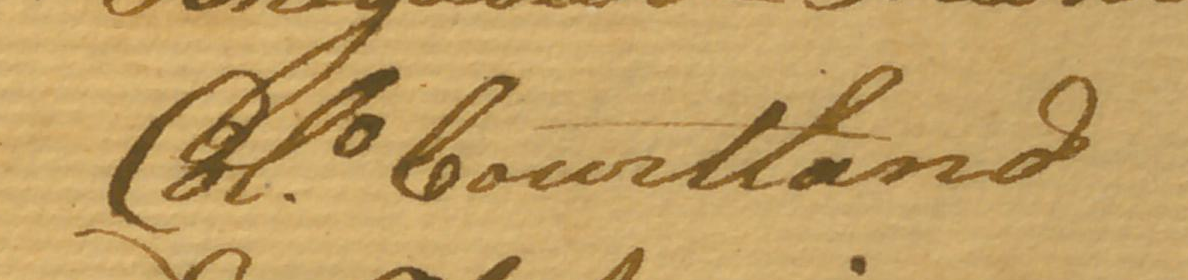Col^o. Courtland
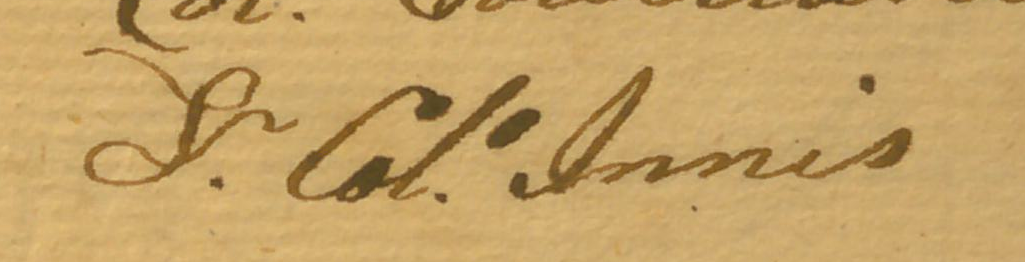L^t. Col^o. Innis
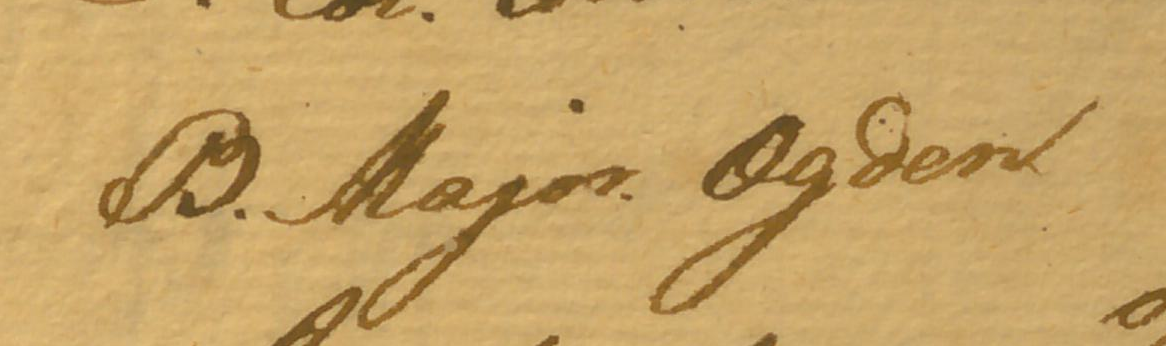B. Major Ogden
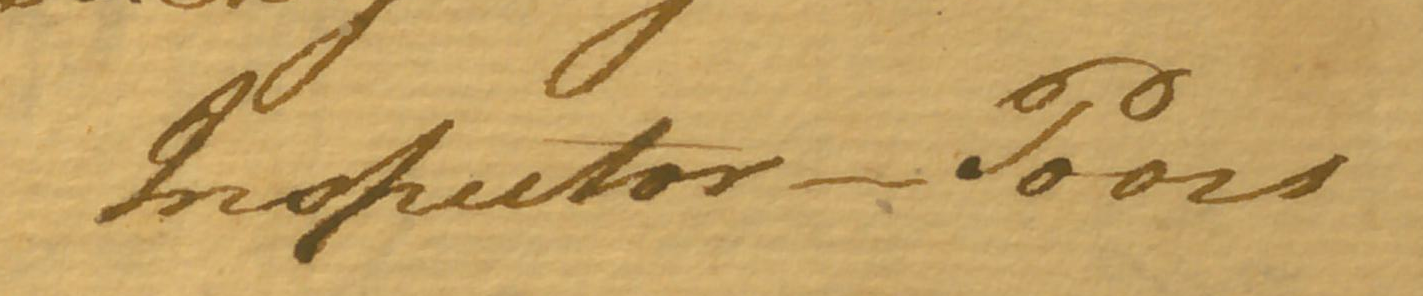Inspector- Poors
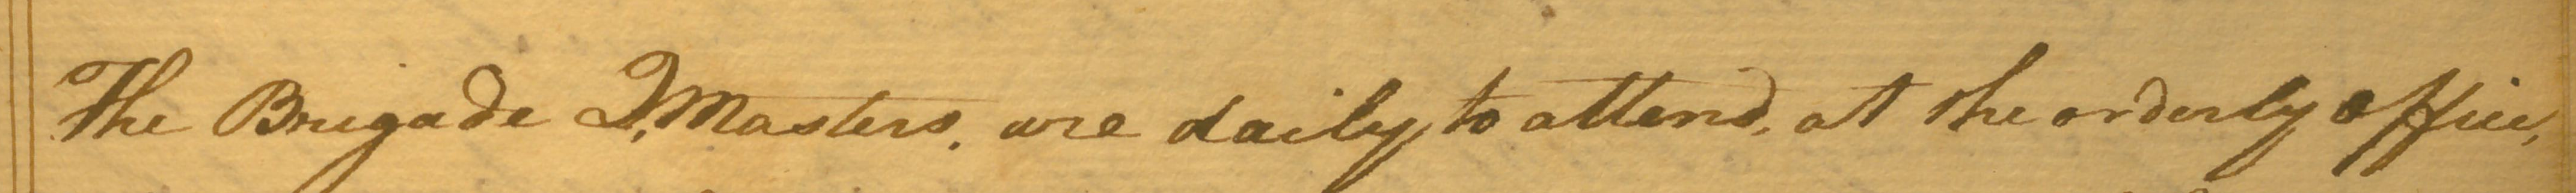The Brigade Q. Masters are daily to attend at the orderly office
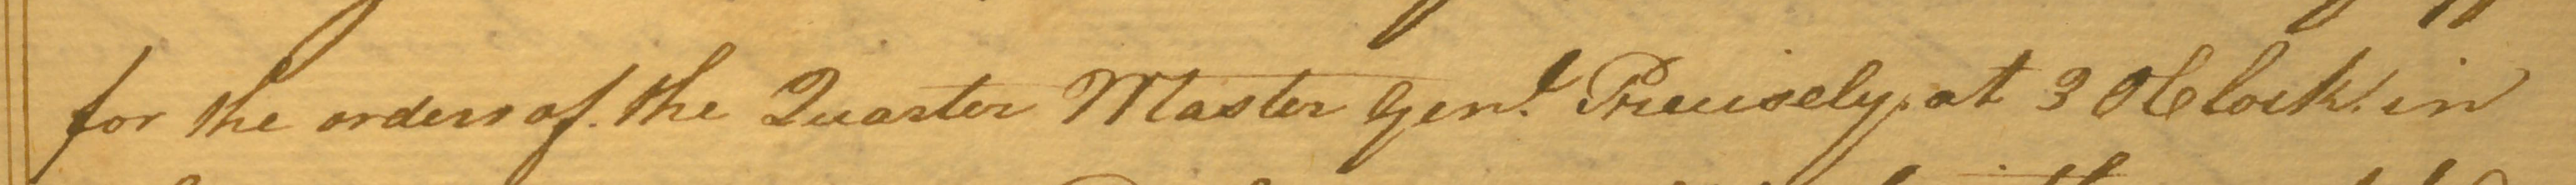for the orders of the Quarter Master Gen^l. Precisely at 3 oClock in
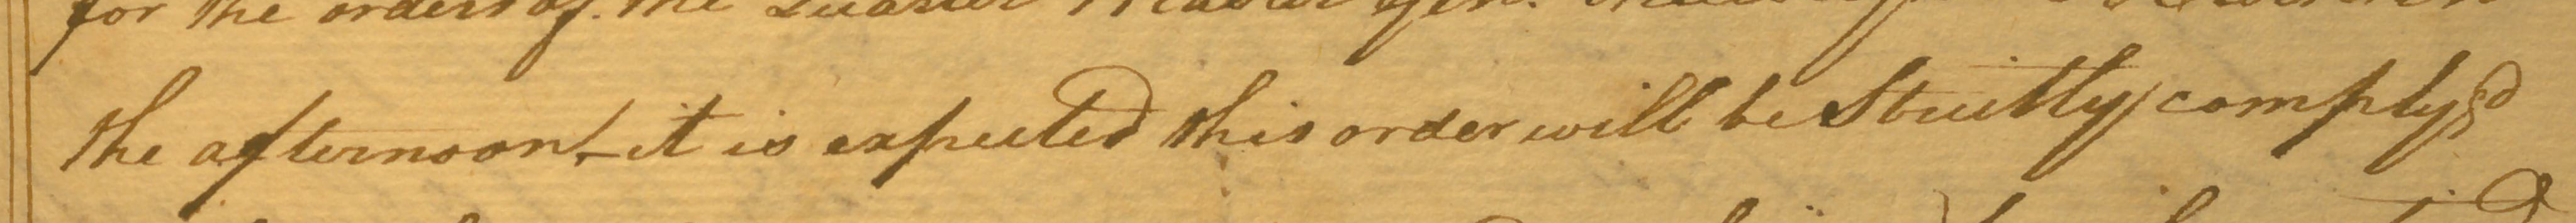the afternoon it is expected this order will be Strictly comply'd
